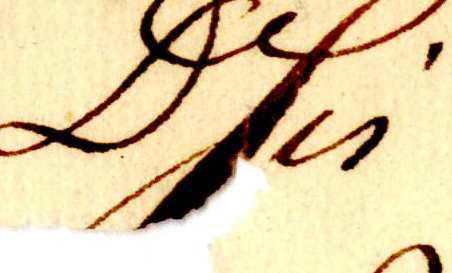D Sir
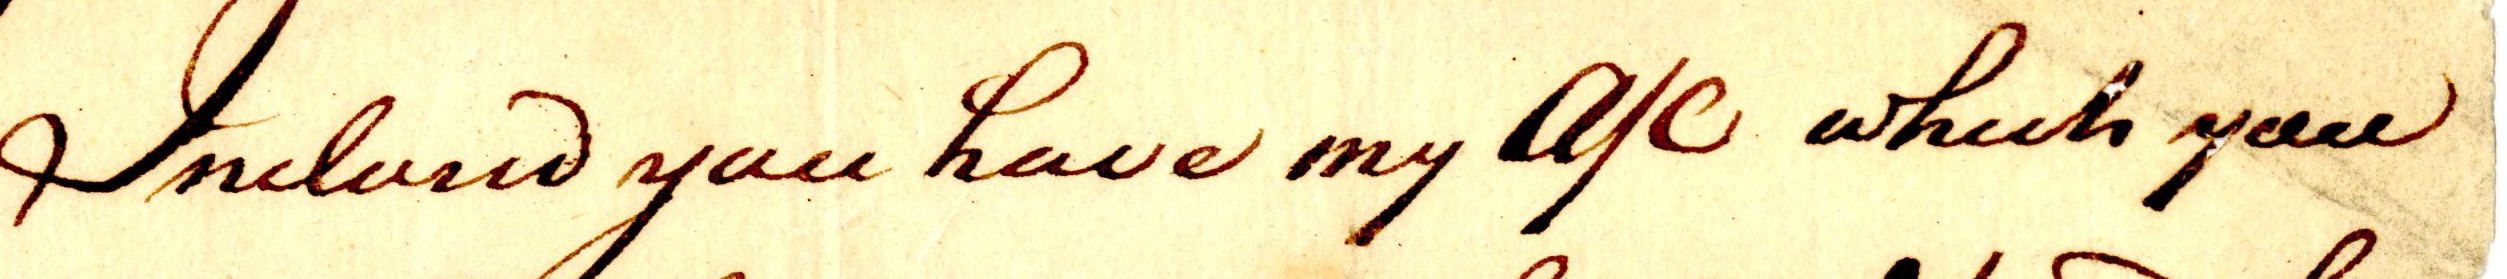Included you have my a/c which you
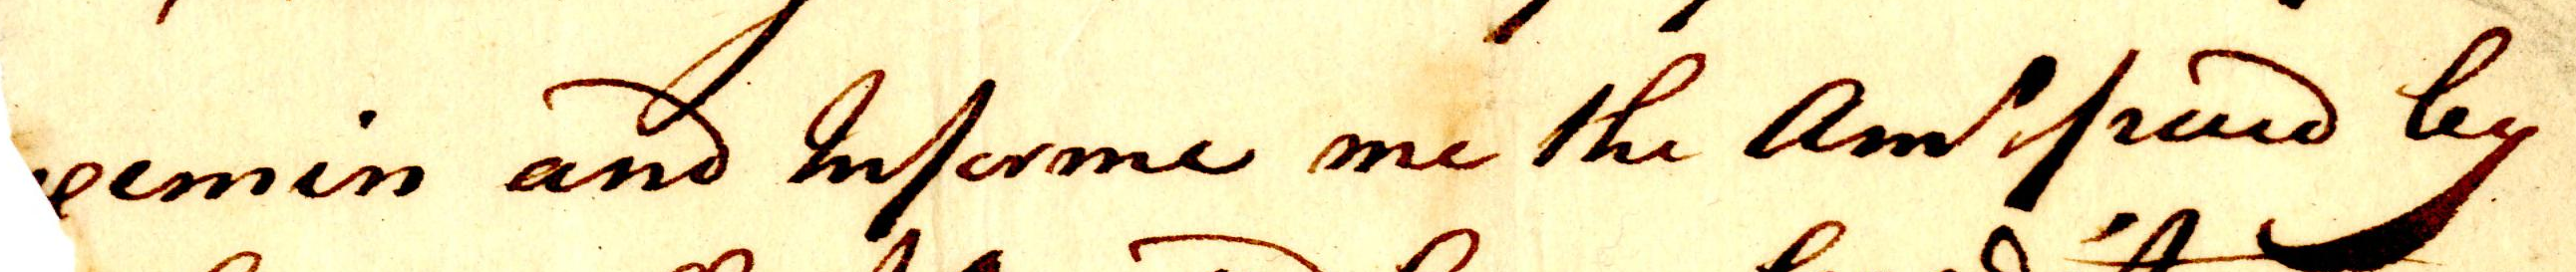[_]emin and informe me the Am^t paid by
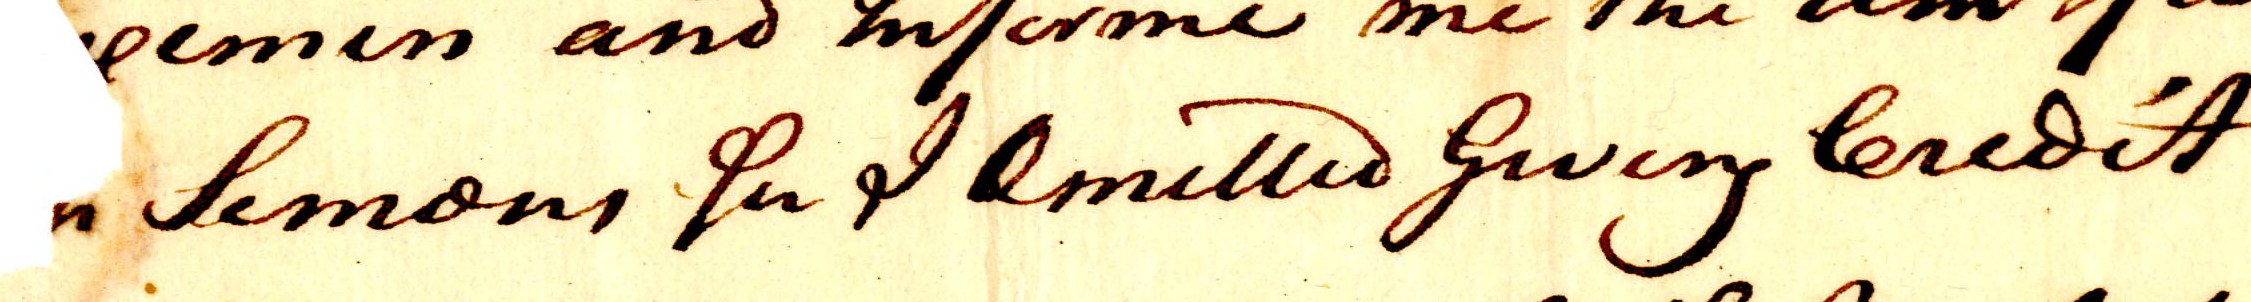n Simons Jn I omitted Giving credit
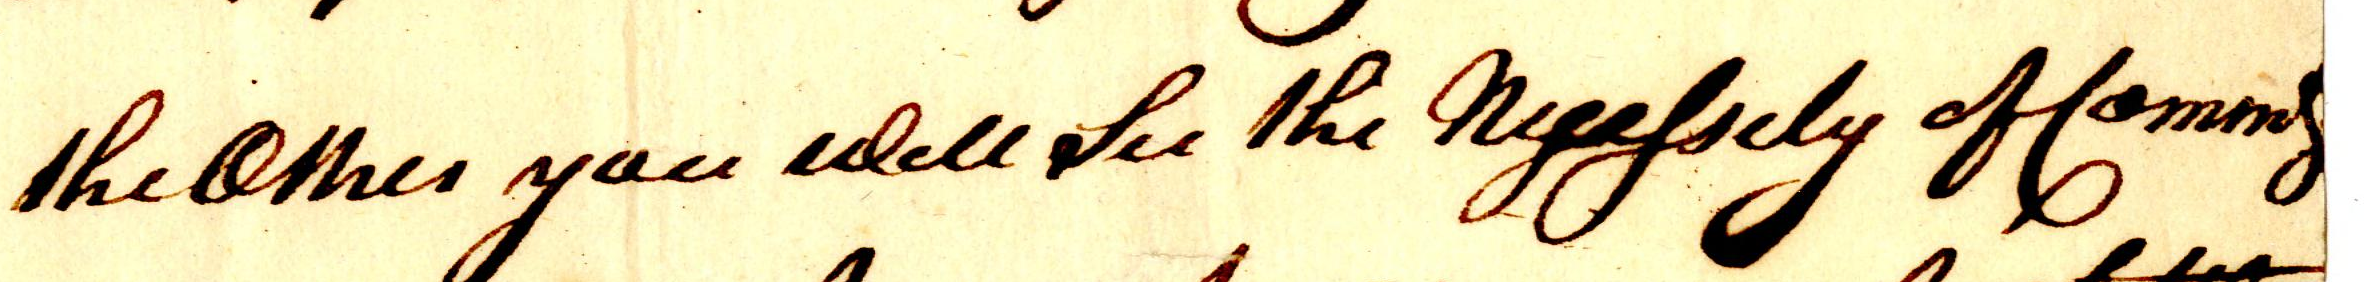the Other you will see the necessity of Comming
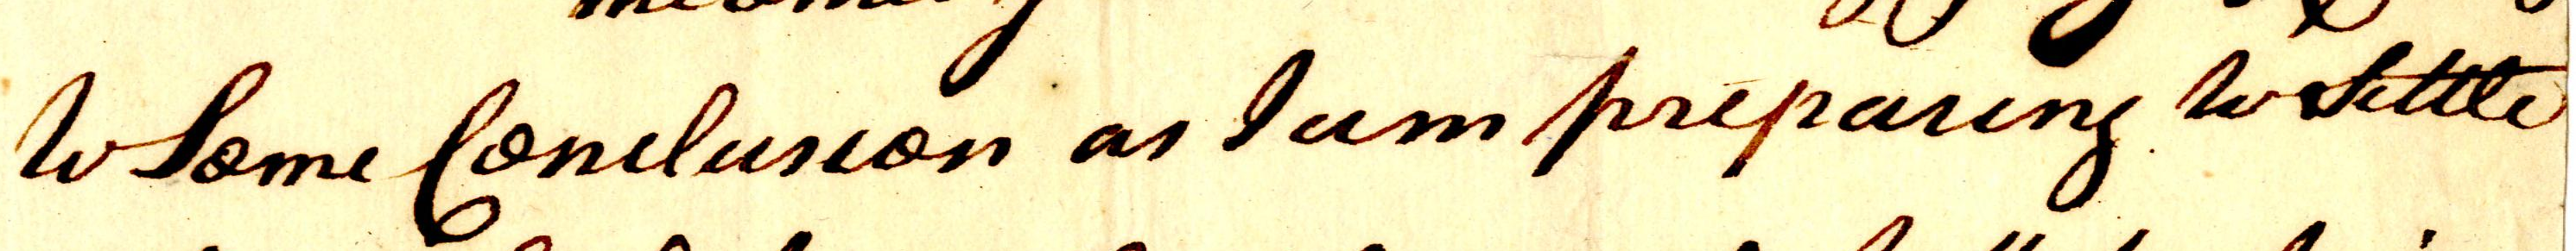to Some Conclusion as I am preparing to Settle
